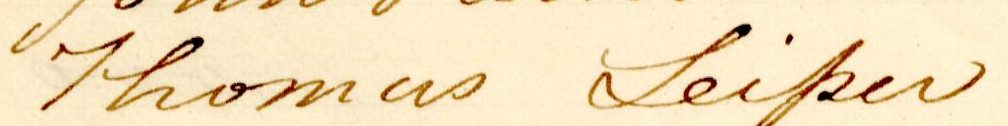Thomas Leiper
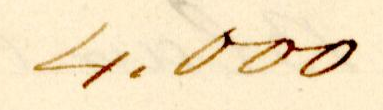4,000
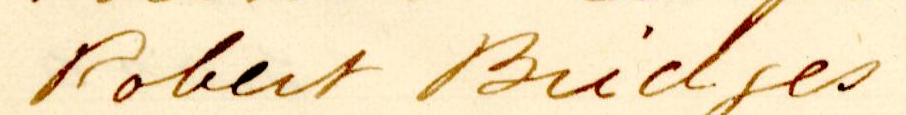Robert Bridges
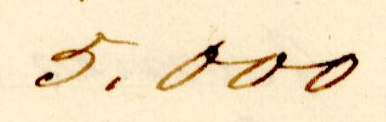5,000
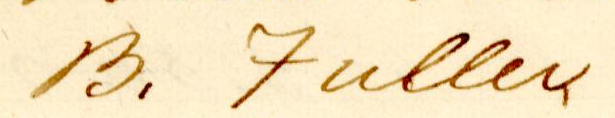B. Fuller
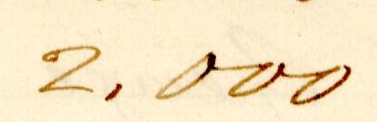2,000
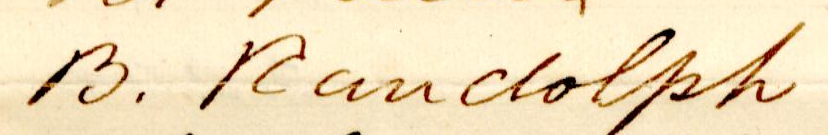B. Randolph
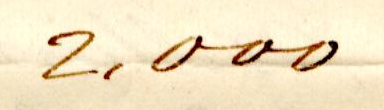2,000
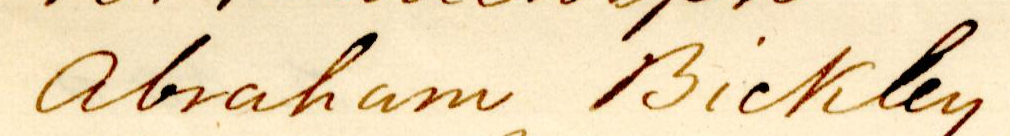Abraham Bickley
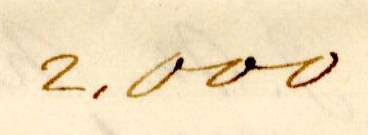2,000
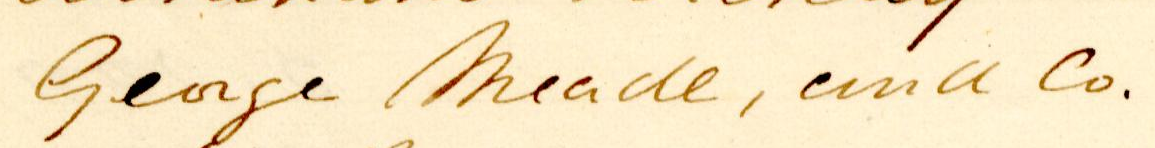George Meade, and Co.
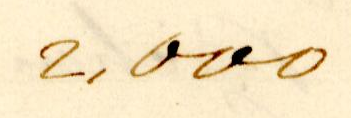2,000
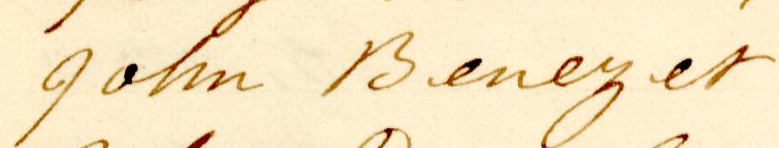John Benezet
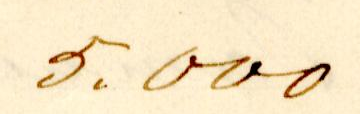5,000
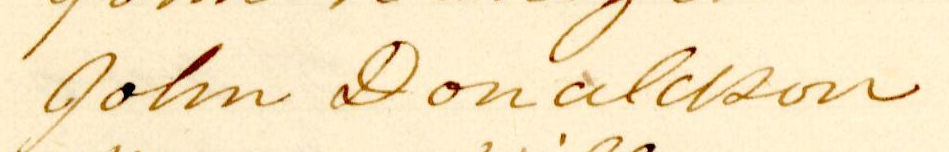John Donaldson
